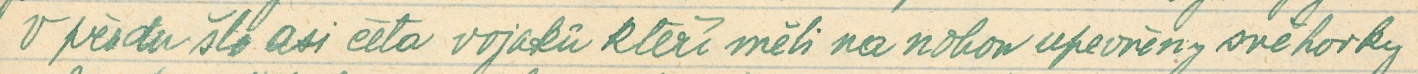V předu šlo asi četa vojaků kteří měli na nohou upevněny svěhovky
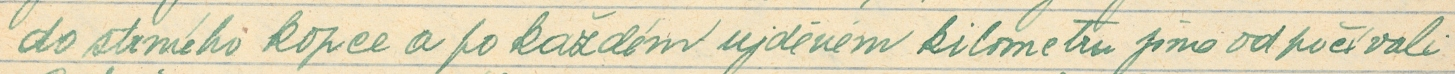do strmého kopce a po každém ujděném kilometru jsme odpočívali.
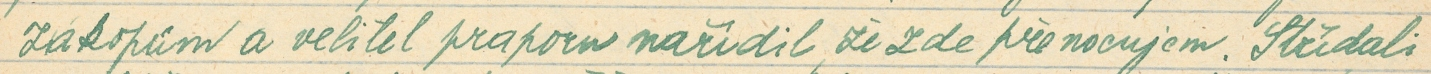zákopům a velitel praporu nařídil, že zde přenocujem. Střídali
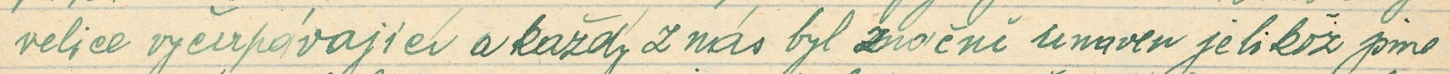velice vyčerpávající a každý z nás byl značně unaven jelikož jsme
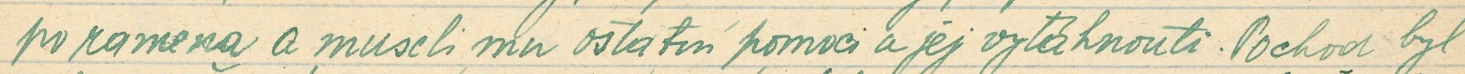po ramena a museli mu ostatní pomoci a jej vytáhnouti. Pochod byl
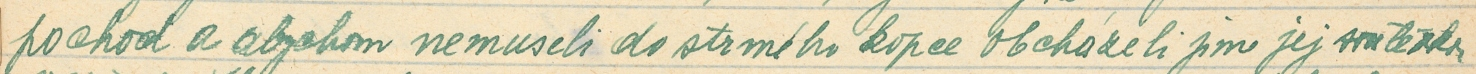pochod a abychom nemuseli do strmého kopce obcházeli jsme jej soutězkou
